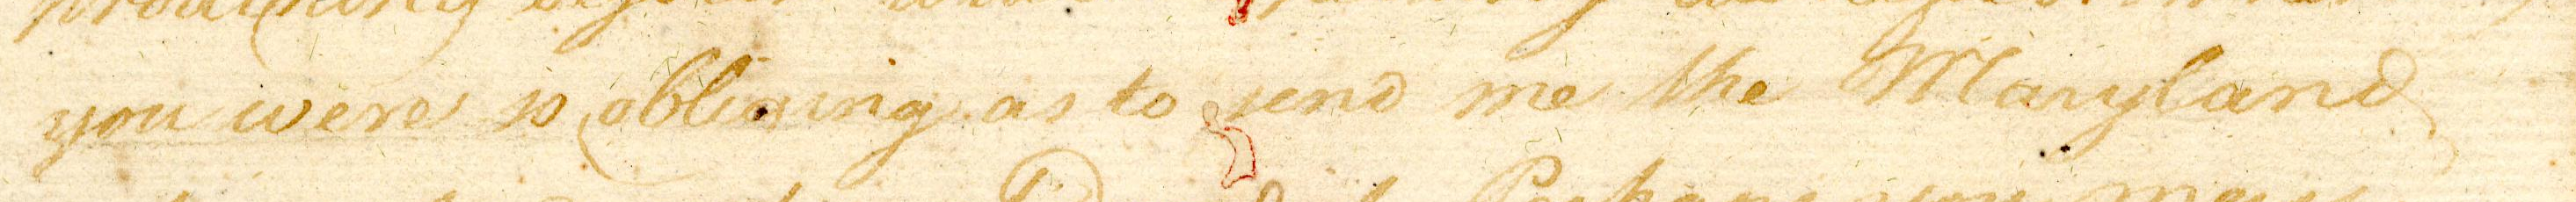you were so obliging as to send me the Maryland
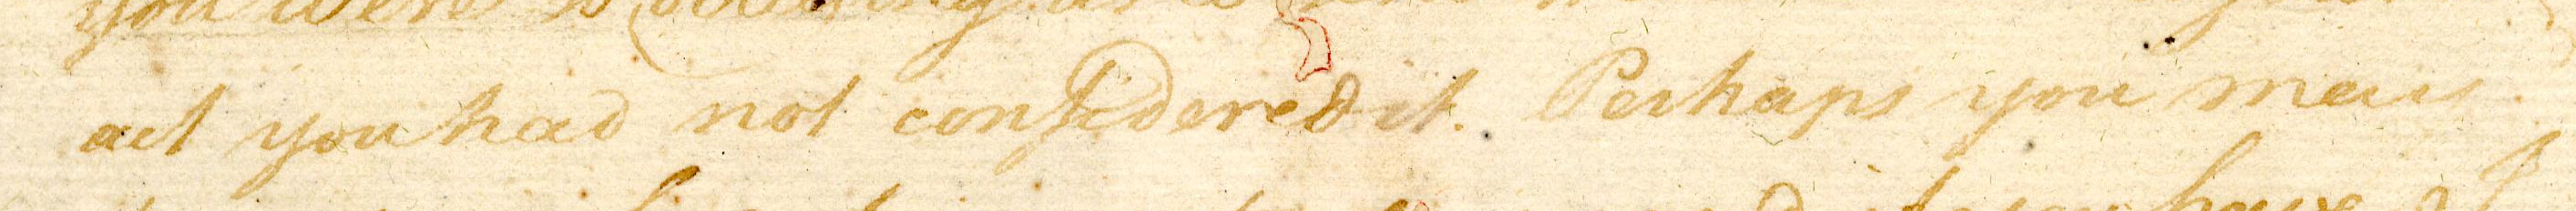act you had not considered it. Perhaps you may
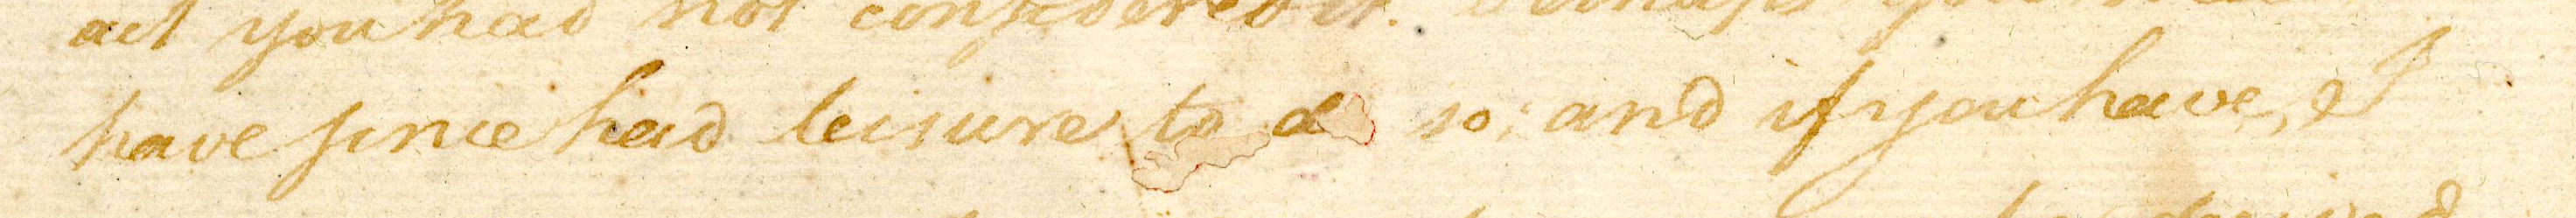have since had leisure to do so and if you have, I
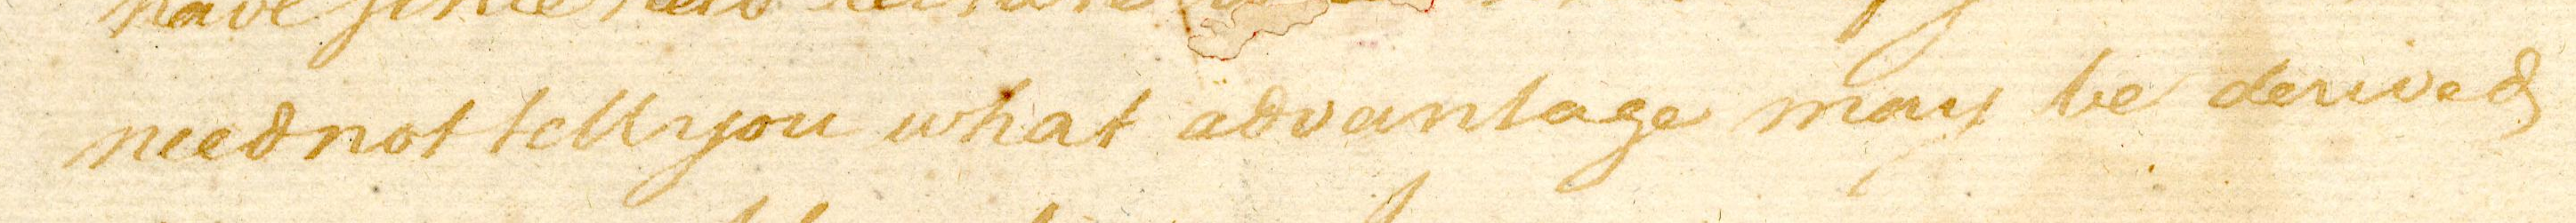need not tell you what advantage may be derived
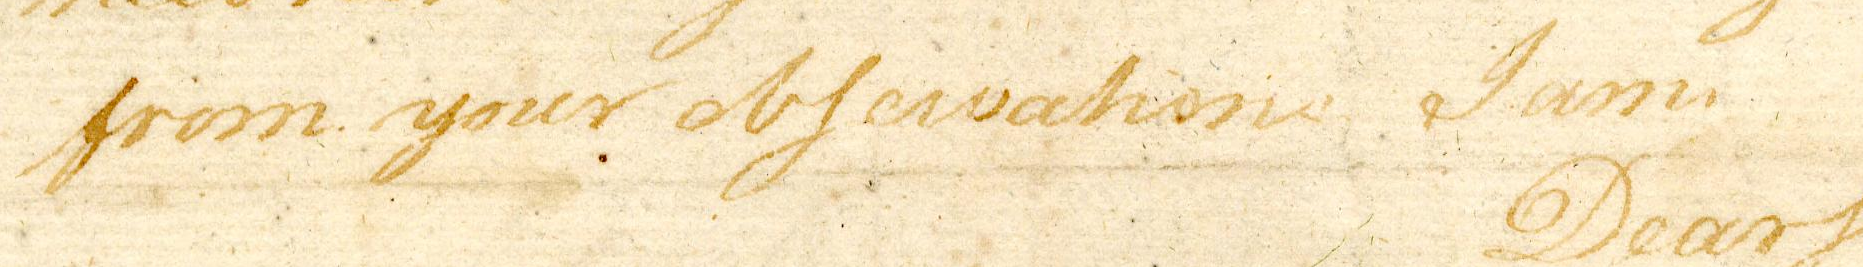from your observations. I am
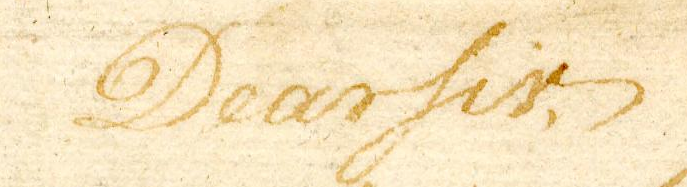Dear sir,
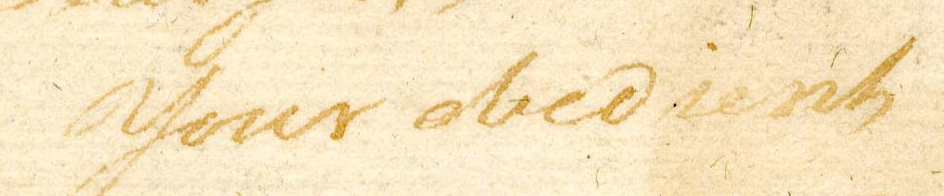Your obedient
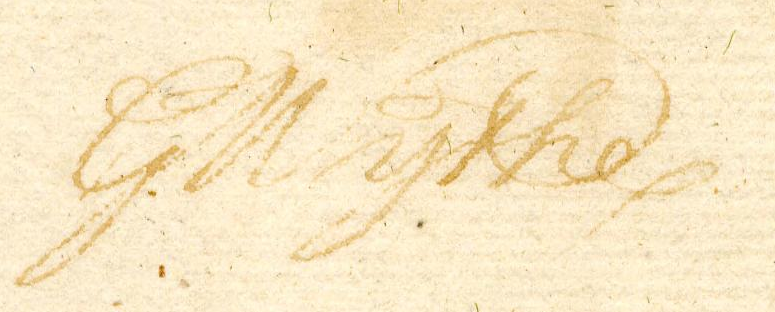G Wythe
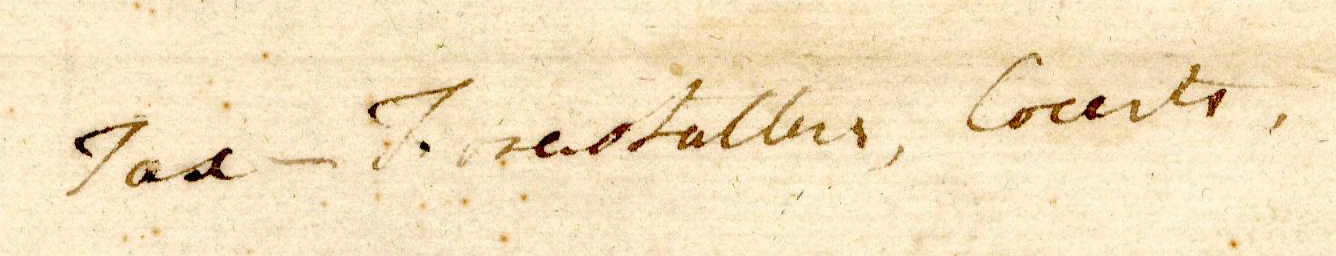Tax- Forestallers , Courts
